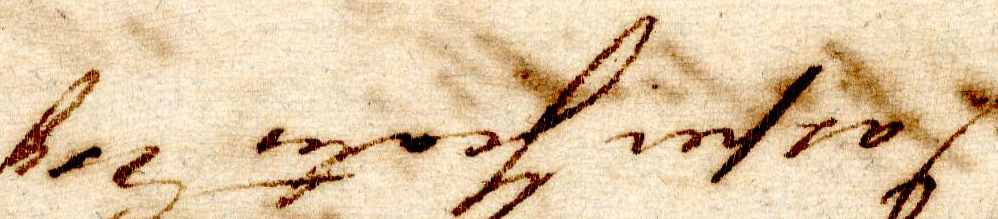Jasper Yeates Esq^r
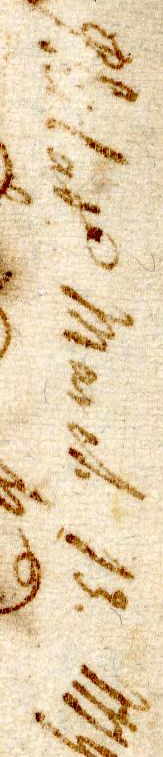Philad^a. March 13. 1779
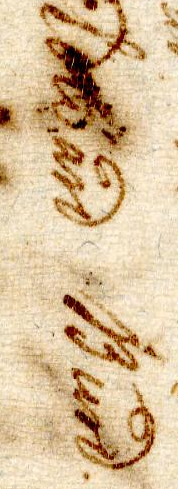Edward Burd.
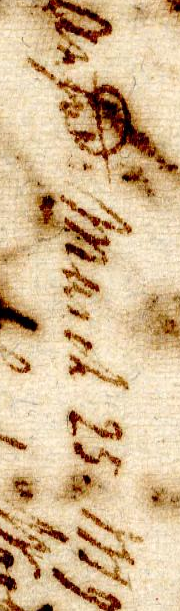Answ^d March 25. 1779
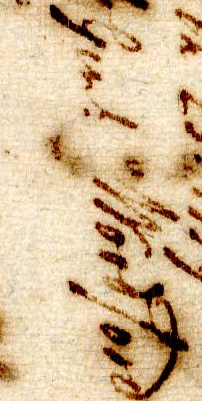Gen^l Woodford
